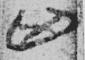凶
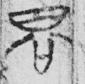君
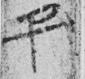子
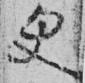夬夬
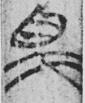蜀（獨）
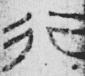行
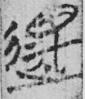遇
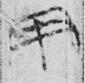雨
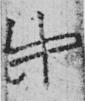女（如）
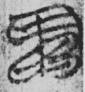雺
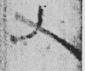又（有）
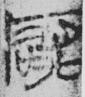○（厲）
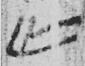亡
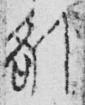咎
